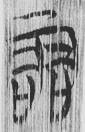霝（靈）
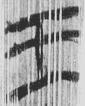王
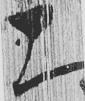云
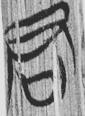君
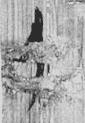人
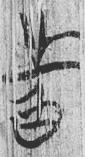者
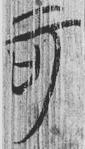可（何）
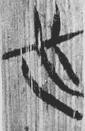必
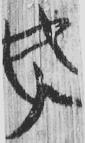𡚦
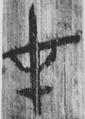才（哉）
